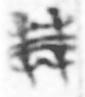𣗥（束）
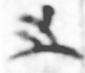之
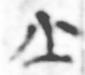少
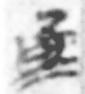爲
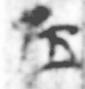○（左）
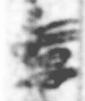驂
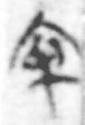牢
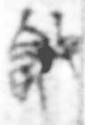○（令）
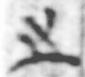之
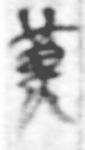黃
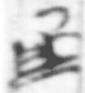爲
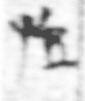○（左）
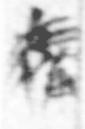○（服）
